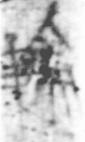輪
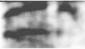二
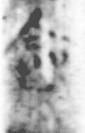弇
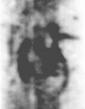紫
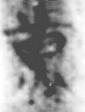黃
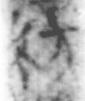紡
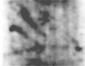之
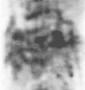綳
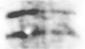二
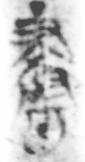○（畫）
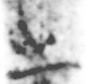之
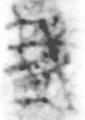載
